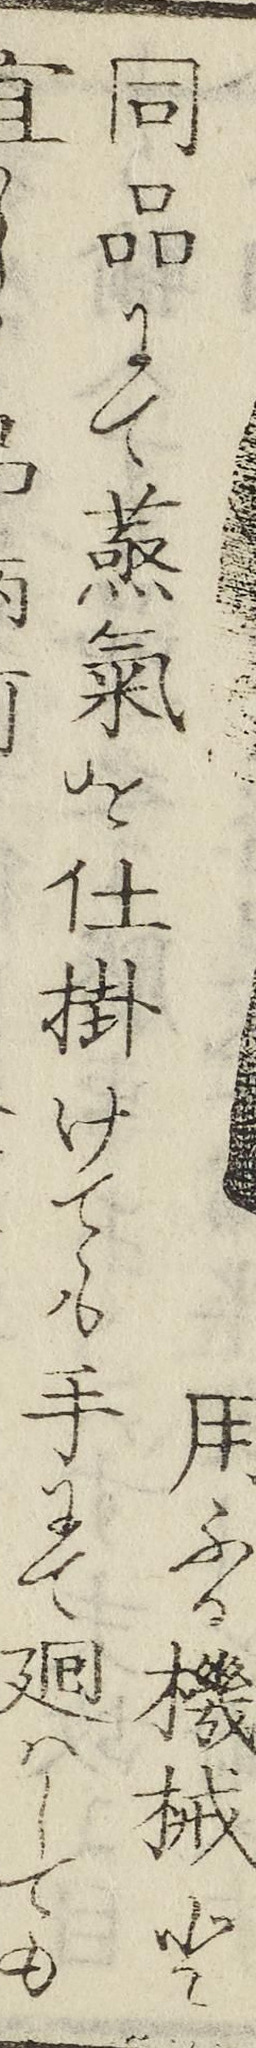同品にて蒸気を仕掛けても手にて廻はしても
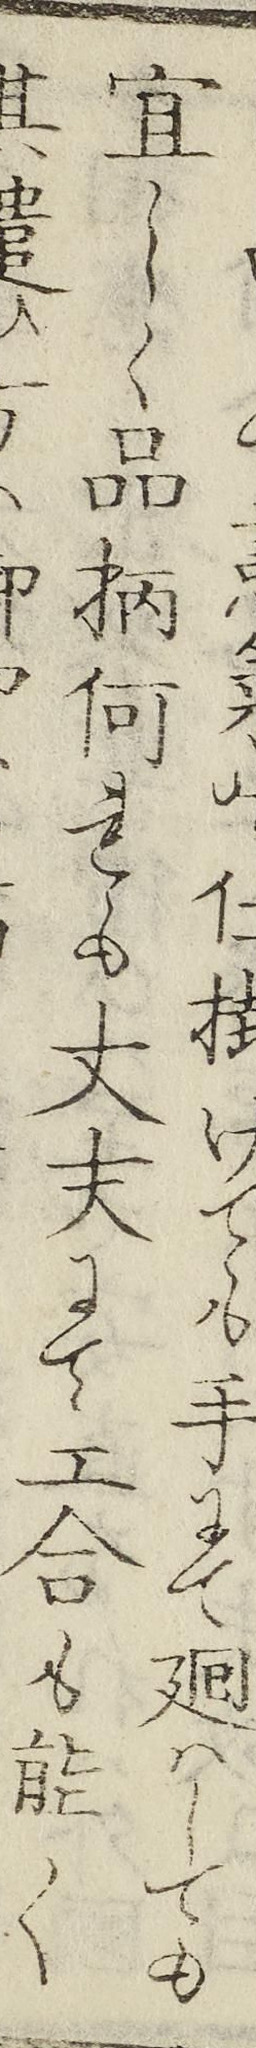宣しく品柄何れも丈夫にて工合も能く
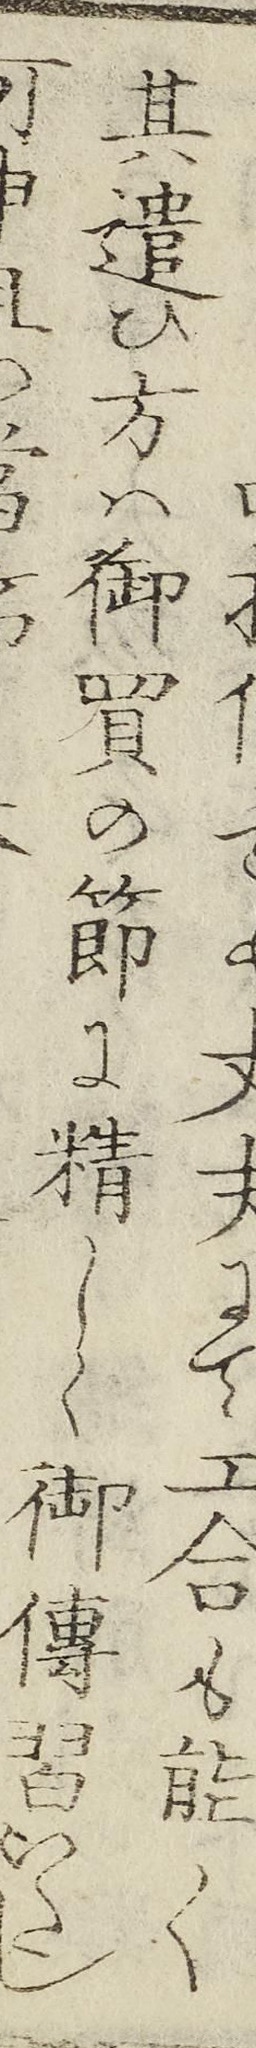其遣ひ方は御買の節に精しく御伝習いたし
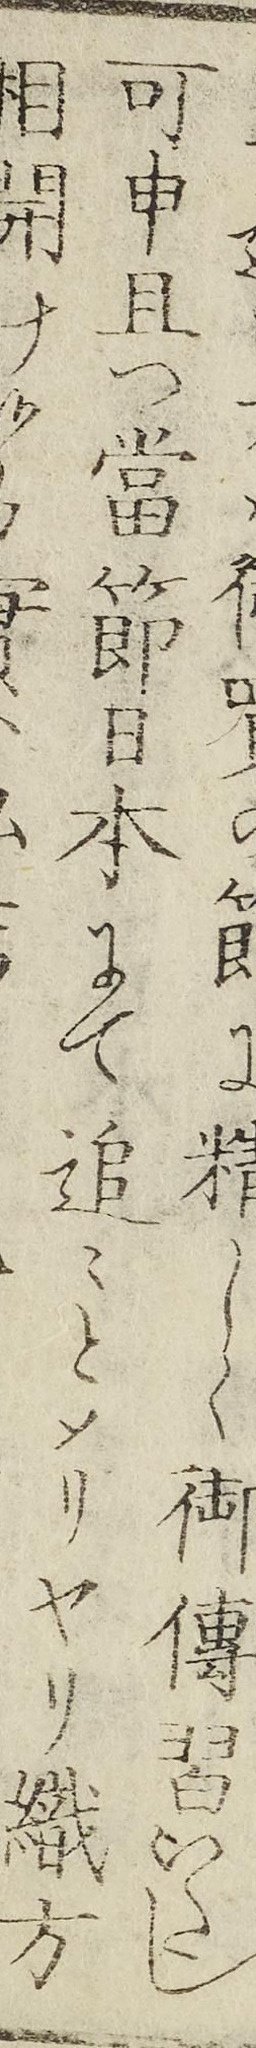可申且つ当節日本にて追〻とメリヤス織方
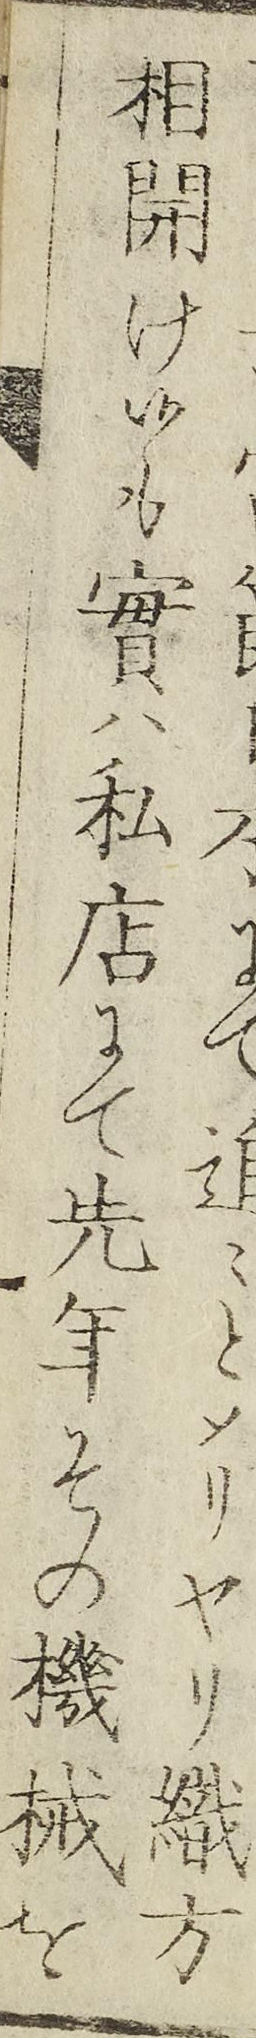相開け候も実は私店にて先年その機会を

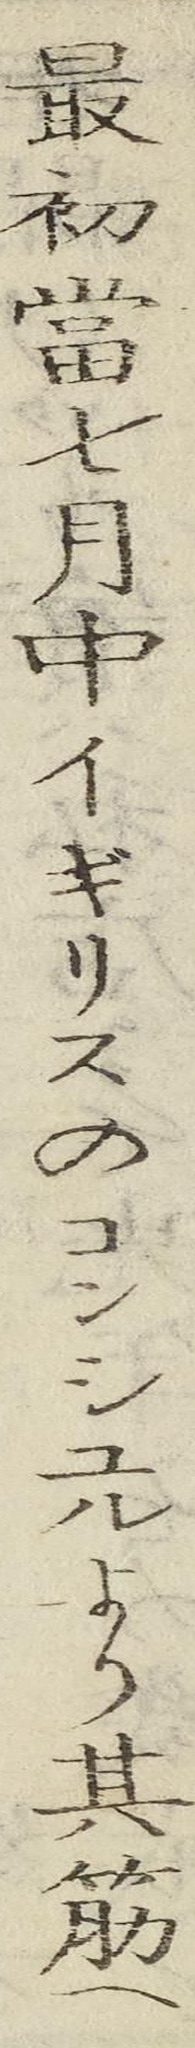最初当七月中イギリスのコンシユルより其筋へ
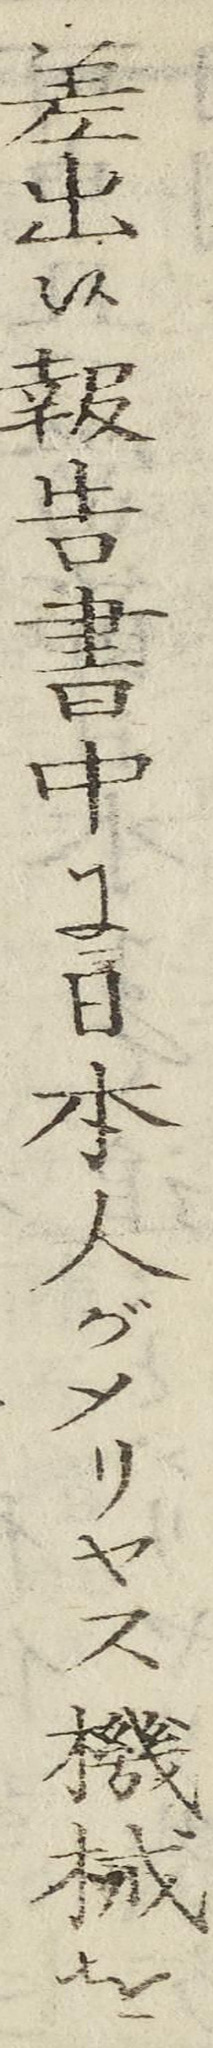差出候報告書中に日本人がメリヤス器械を
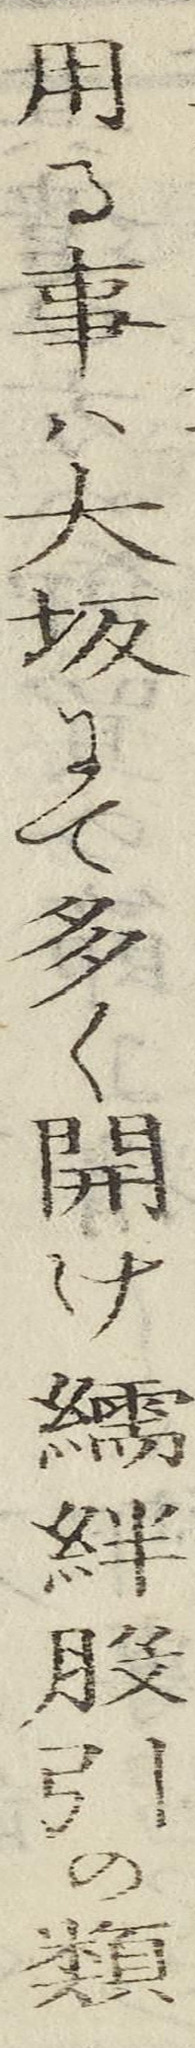用る事は大坂にて多く開け襦絆股引の類
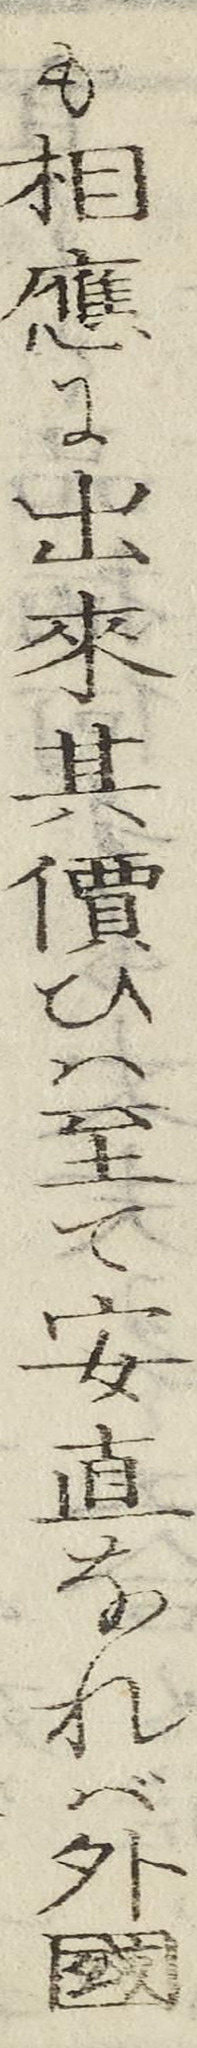も相応に出来其価ひは至て安直なれば外国
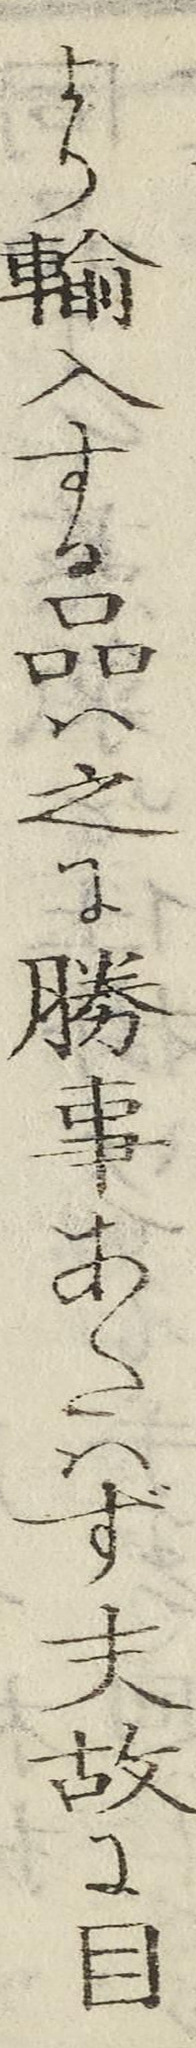より輸入する品は之に勝事あたはず夫故に目
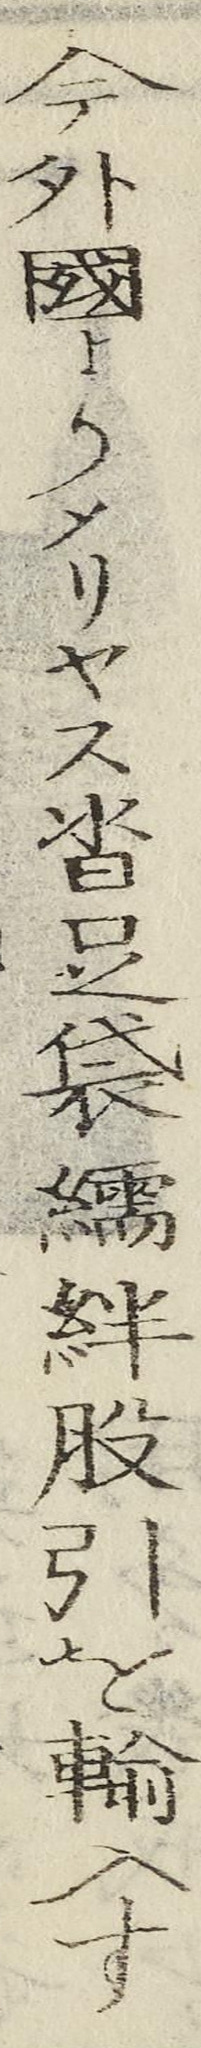今外国よりメリヤス沓足袋襦絆股引を輸入す
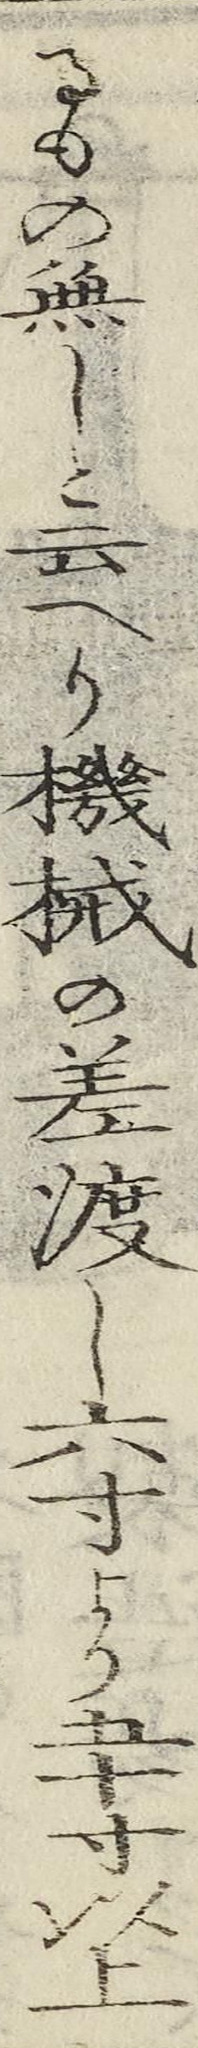るもの無しと云へり機械の差渡し六寸より五十寸以上
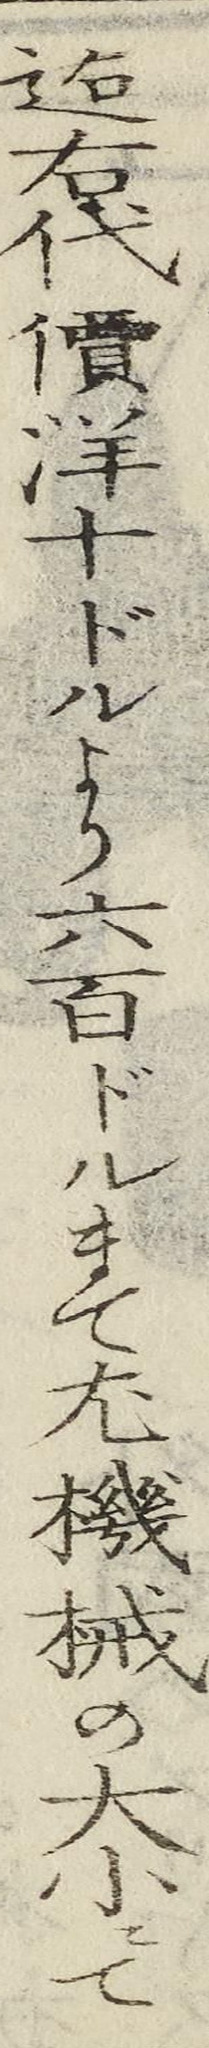迄右代価洋十ドルより六百ドルまて尤機械の大小にて
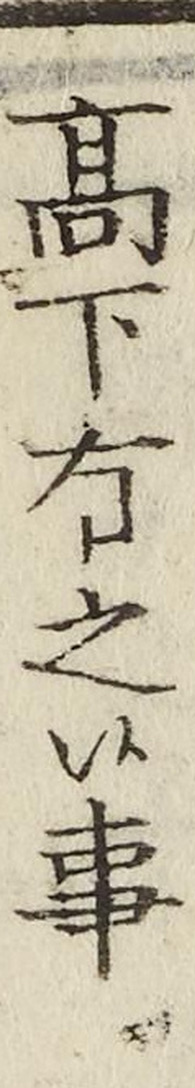高下有之候事
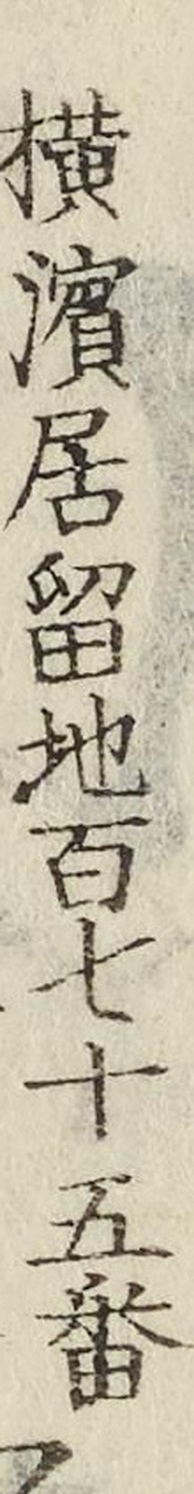横浜居留地百七十五番
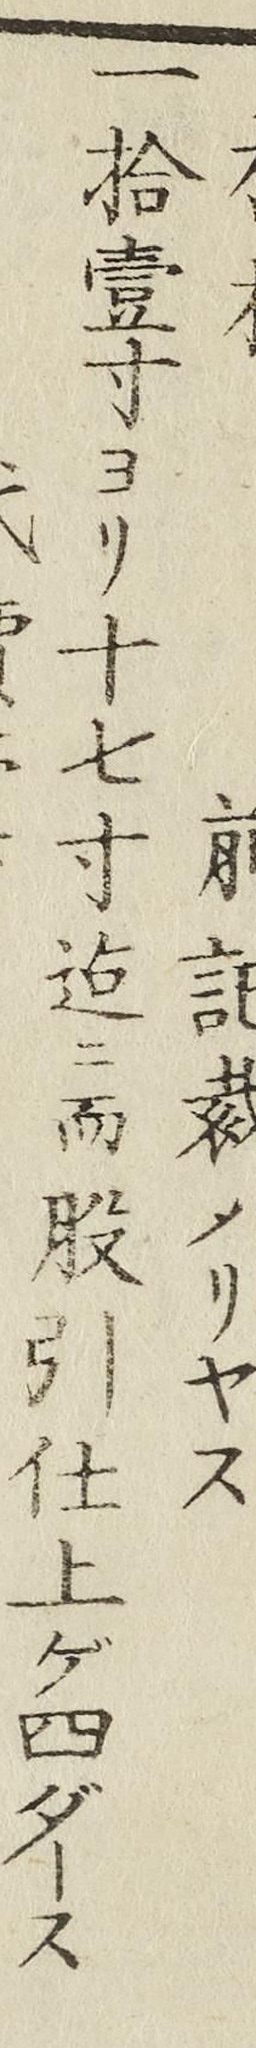一拾壹寸ヨリ十七寸迄ニ而股引仕上ゲ四ダース
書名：[時計に関する冊子]
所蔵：東京大学地震研究所図書室 Earthquake Research Institute Library, The University of Tokyo, JAPAN
